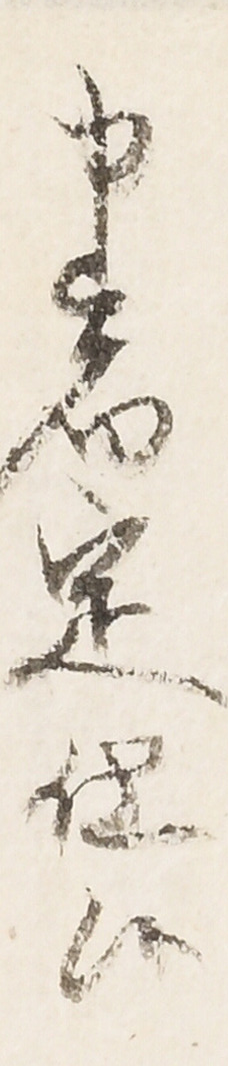申者定仕候
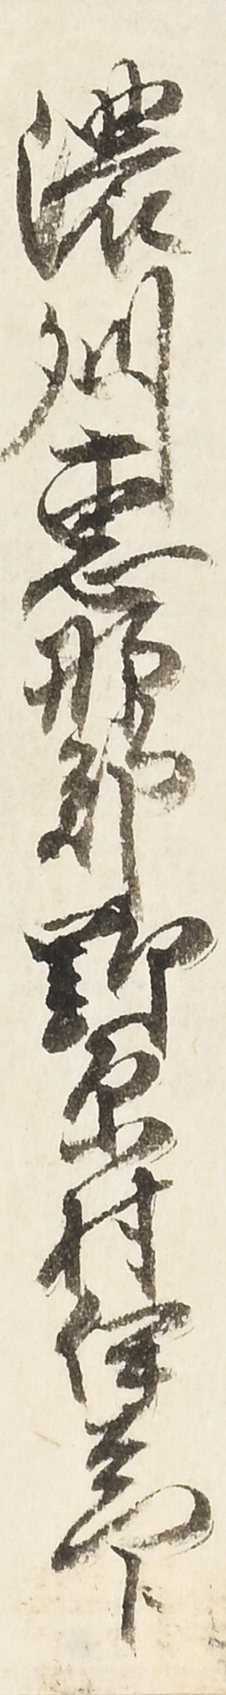濃州恵那郡野原村伊右衛門ト
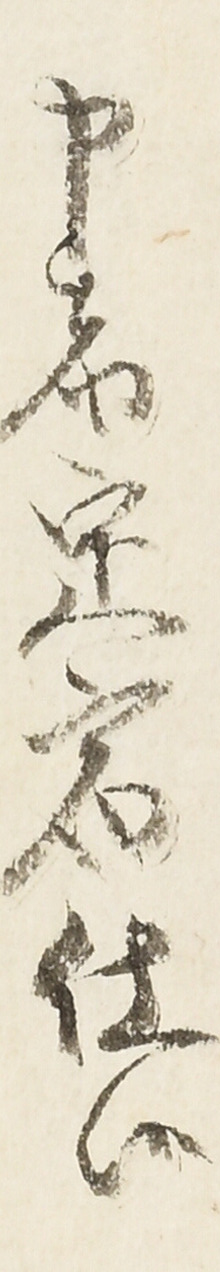申者定宿仕候

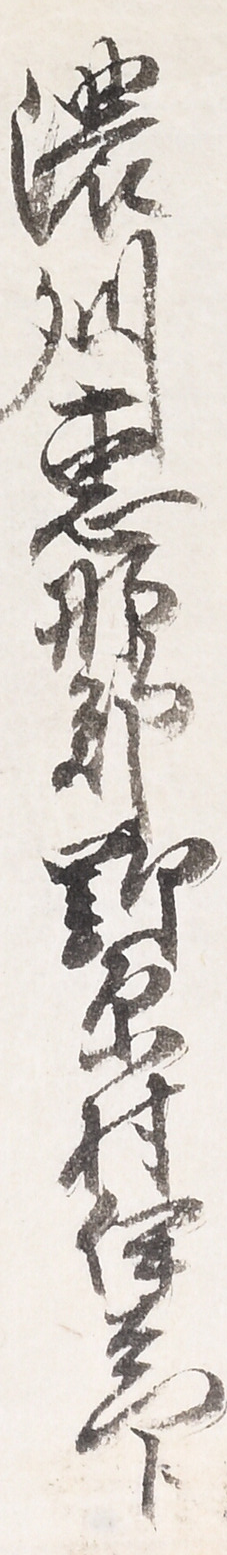濃州恵那郡野原村伊右衛門ト
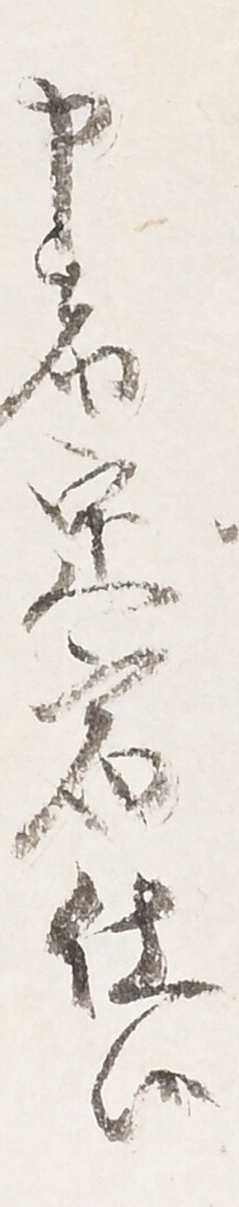申宿定宿仕候
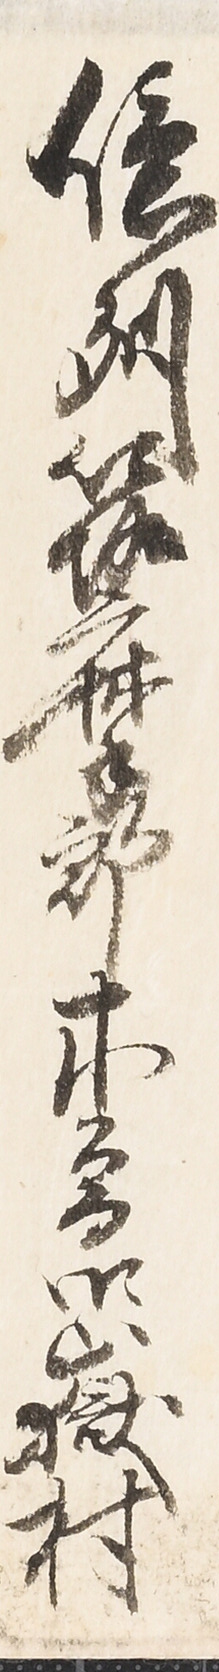信州筑摩郡木曾御嶽村
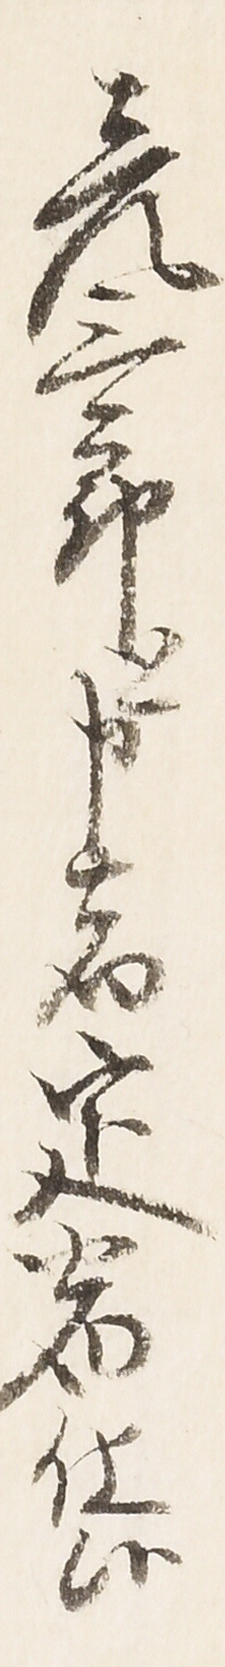彦三郎と申者定宿仕候
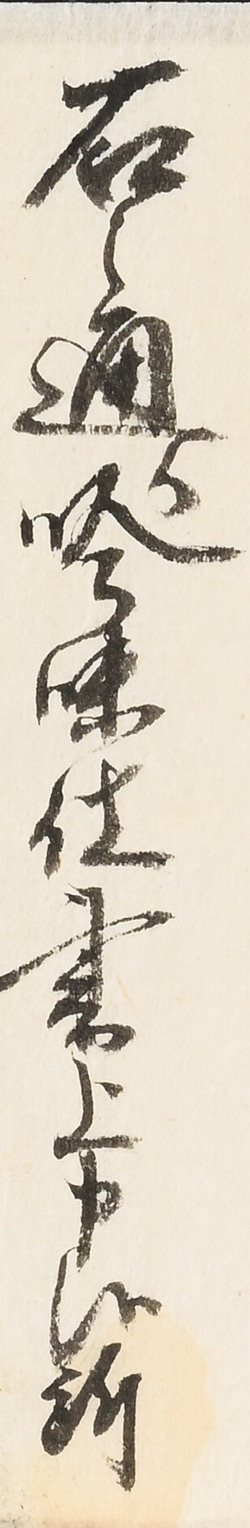右之通り吟味仕書上申候所
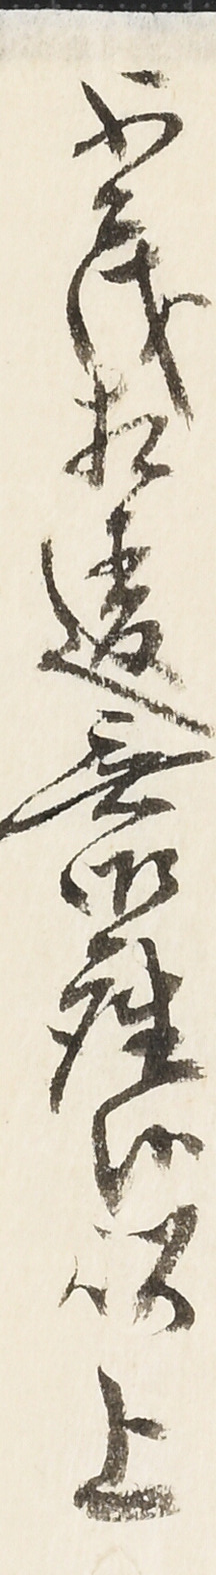少茂相違無御座候以上
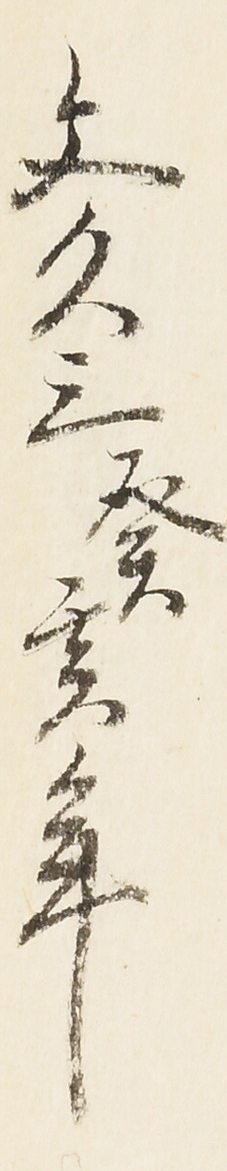文久三癸亥年
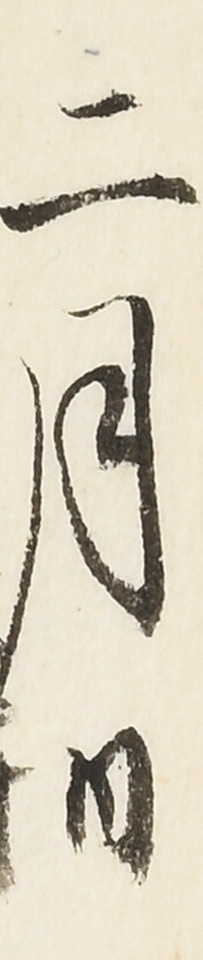二月日

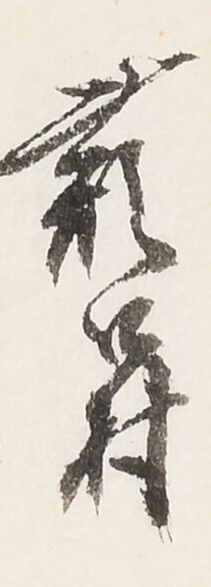荊口村
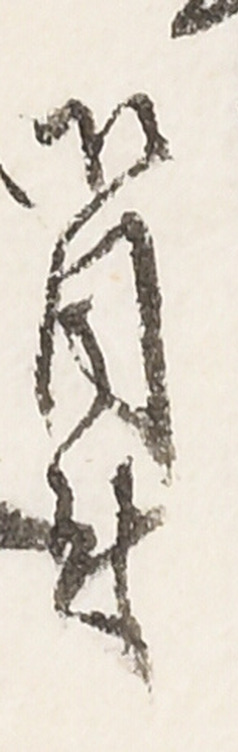御目付
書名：文久三癸亥年二月日他国石切稼書上帳
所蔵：伊那市立高遠町図書館・合同会社AMANE
